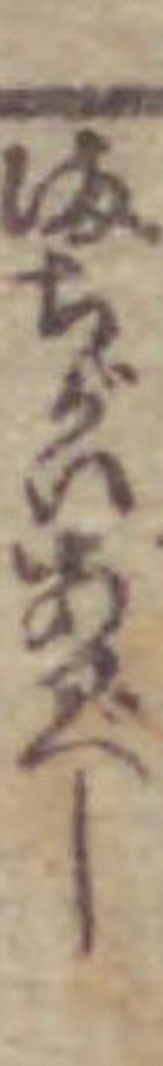まちがいあるべし
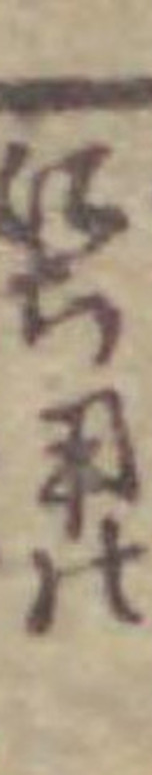にち用の
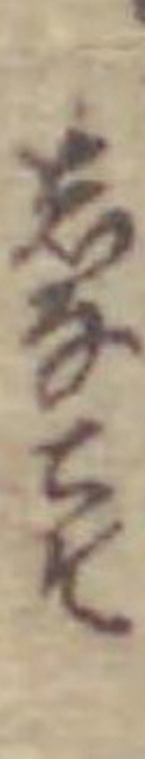しなこそ

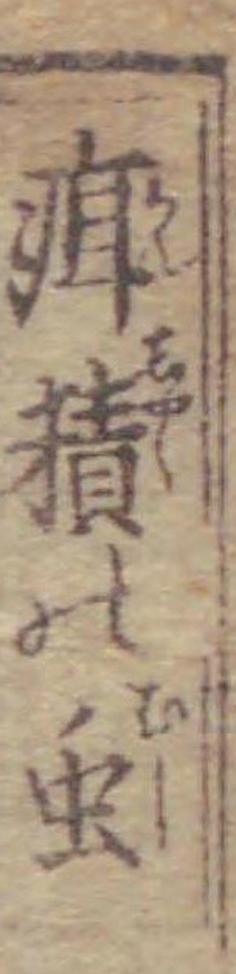疳積の虫
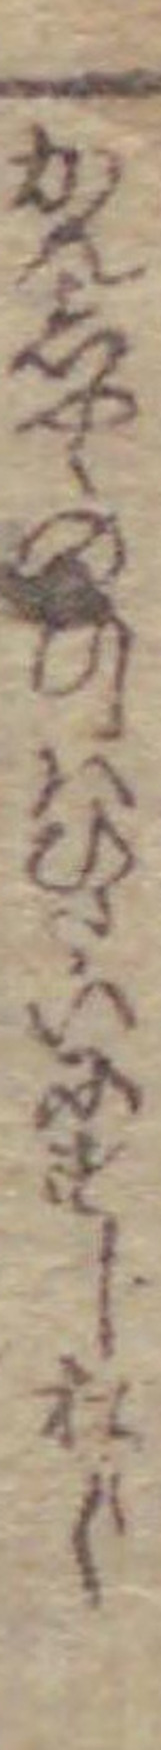かんしやくのむしはひたいにすじおゝく
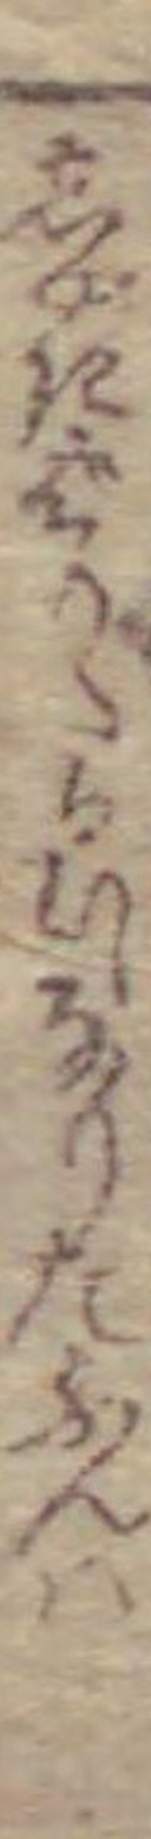しやきばりたるむしなりたふんは
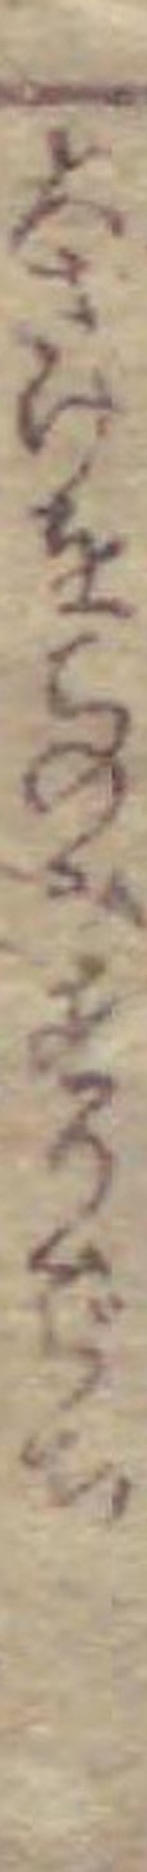大さけをこのみすりばち
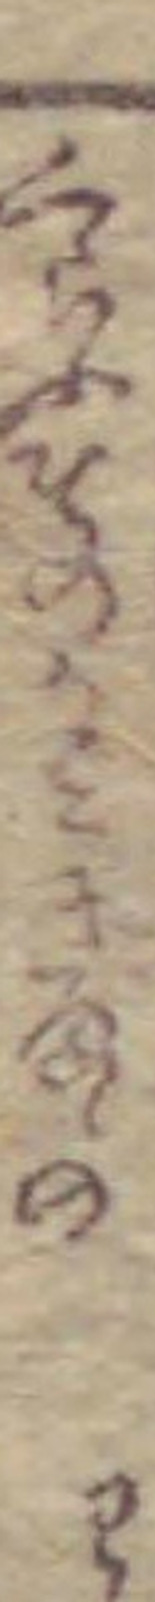くらふそのかみきまゝの
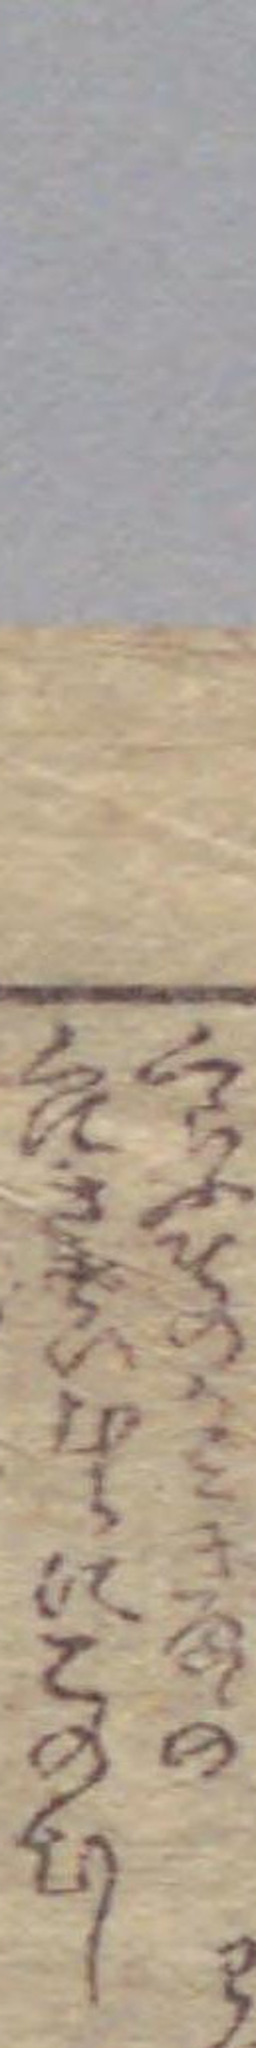くにきずいむらにこのむし
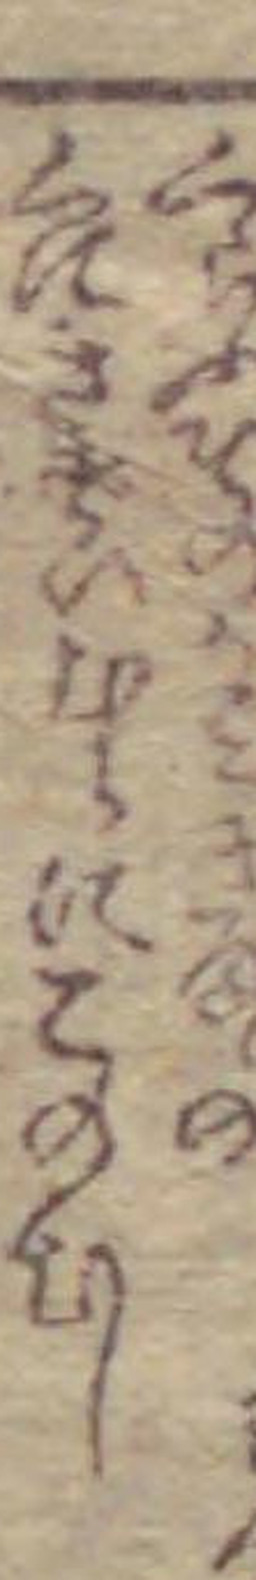くにきずいむらにこのむし
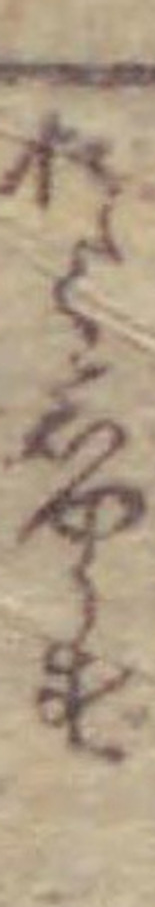おゝくしやうす
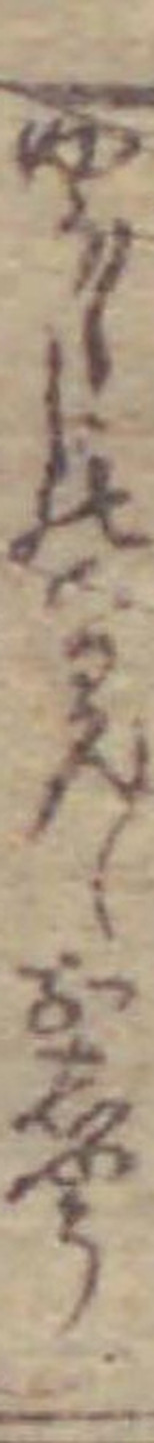やう〳〵じのくわん〳〵おしやう
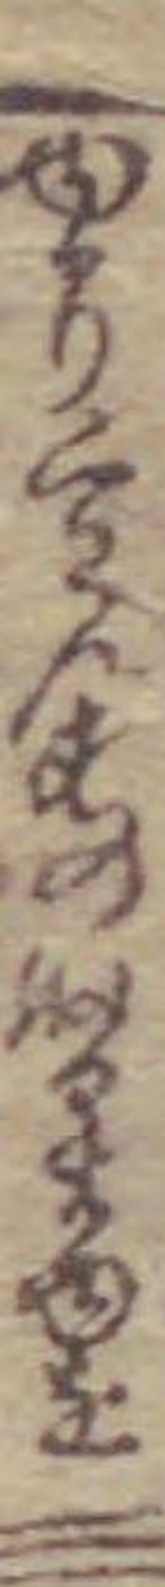ゆるりくわんすのぬるまゆを
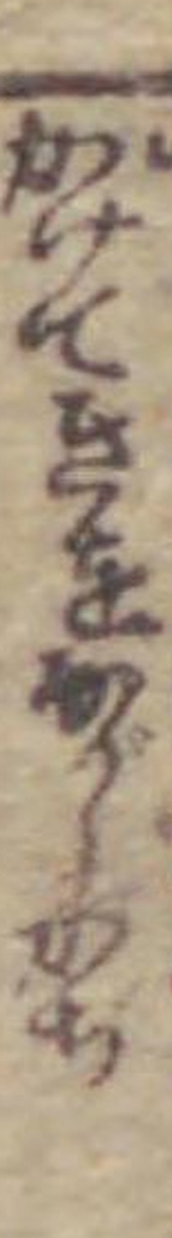かけてきをながしかち
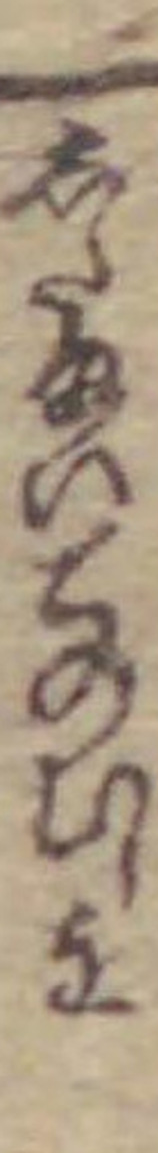したまいこのむしを
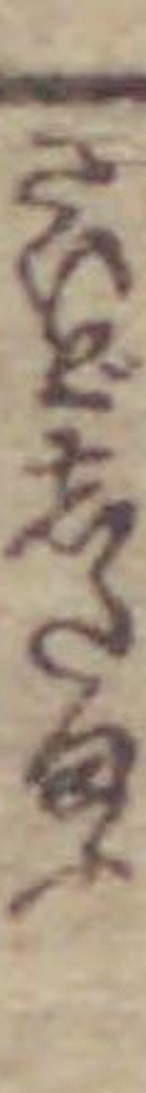さいどしたまふ
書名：化物和本草 : 3巻
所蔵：国立国会図書館 National Diet Library, JAPAN
